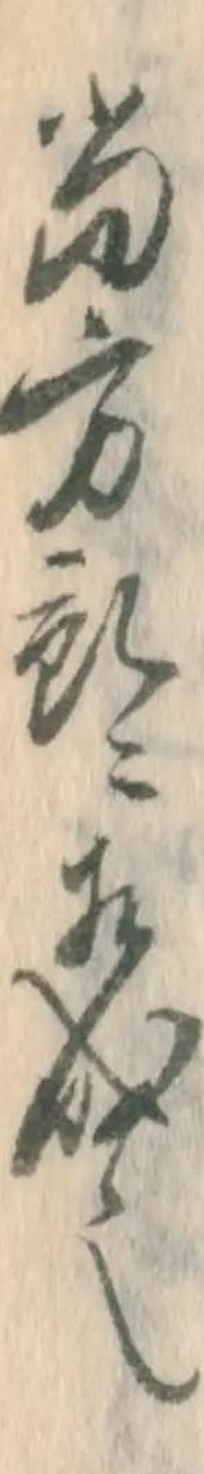當方預ニ相成候也

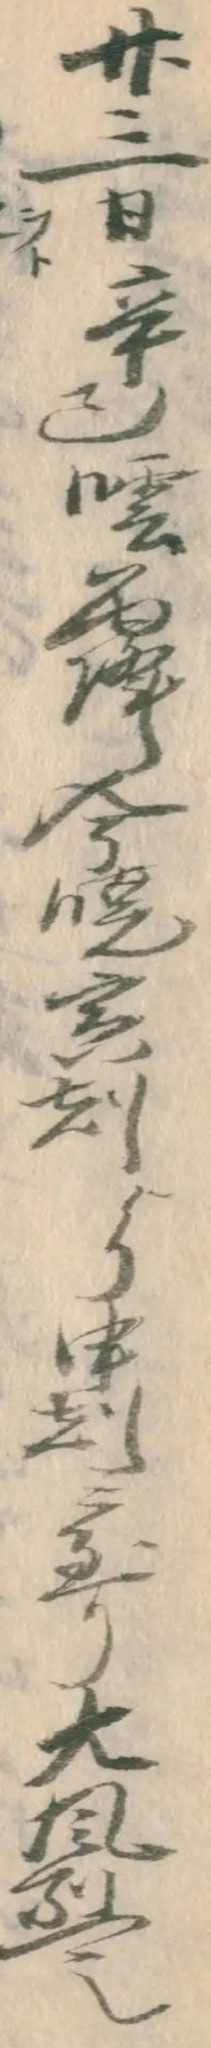廿三日辛巳曇り雨降今晩寅刻より申刻ニ至り大風烈也
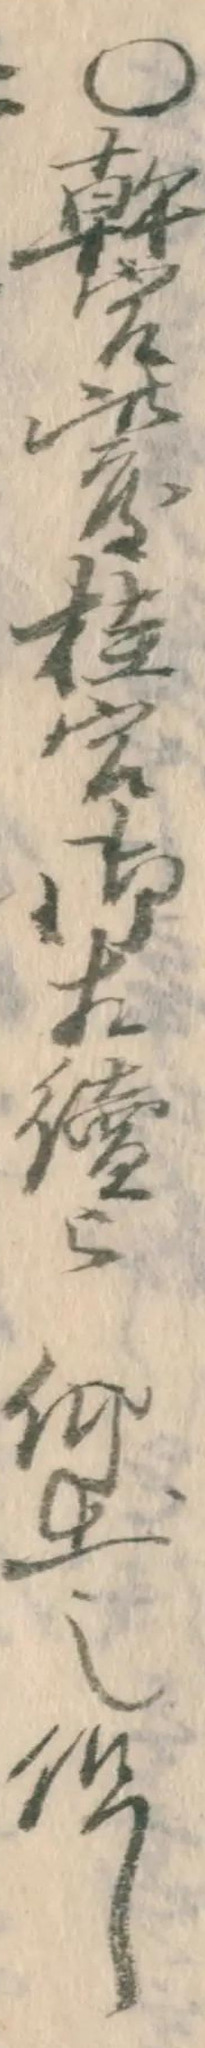○幹宮此度桂宮御相續被仰出之但し
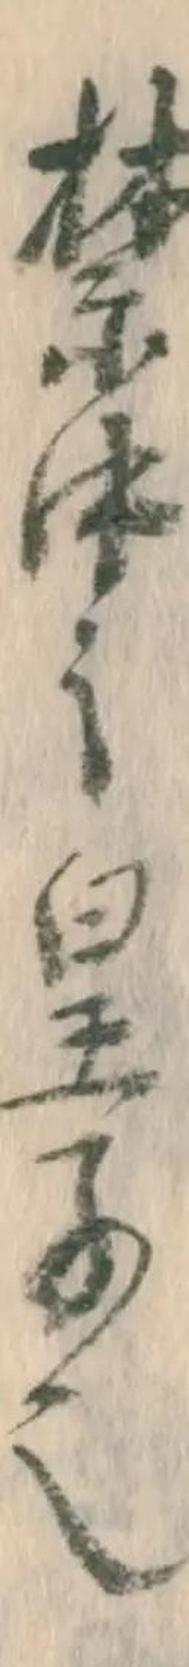禁中之皇子也
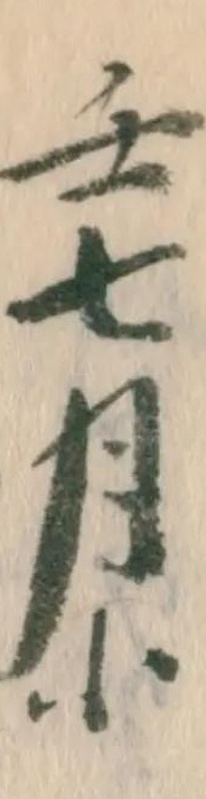壬七月小
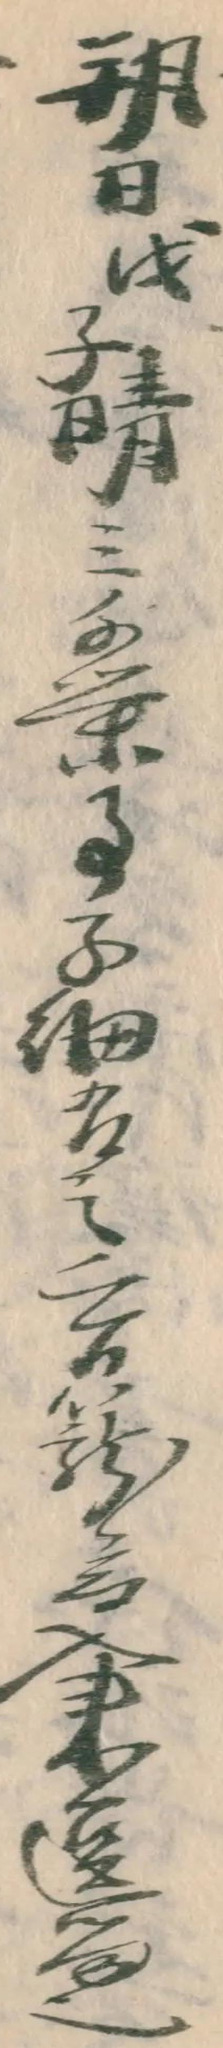朔日戊子晴三千栄事子細有之今日籠ニ而入来逗留也
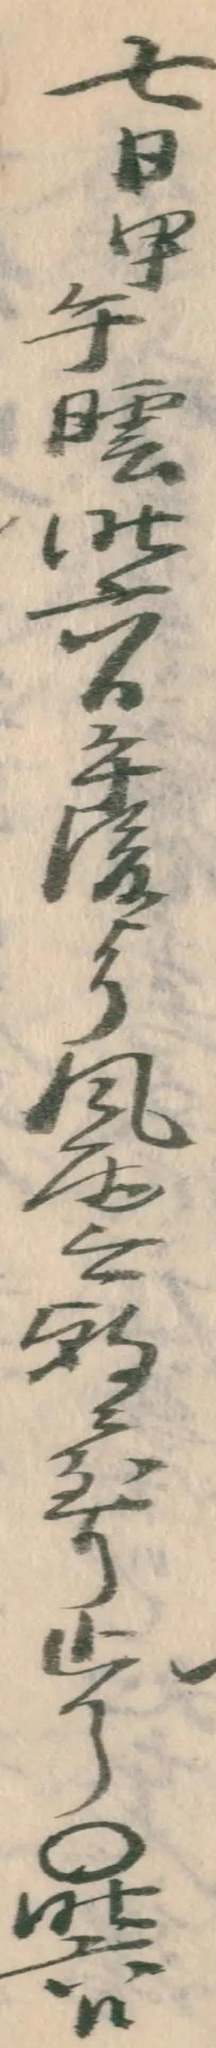七日甲午曇昨六日午後より風雨今朝ニ至り止了○昨六日
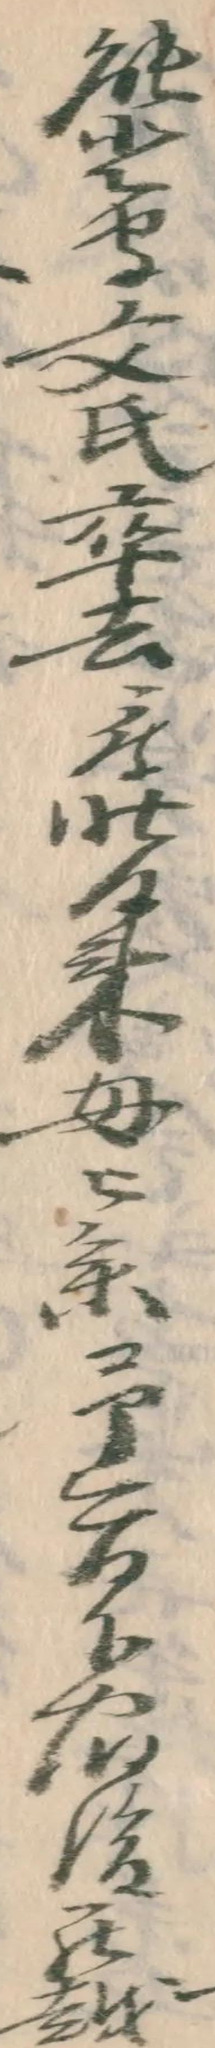能登守文氏卒去ニ付昨日来母被参予今日下宿後罷越
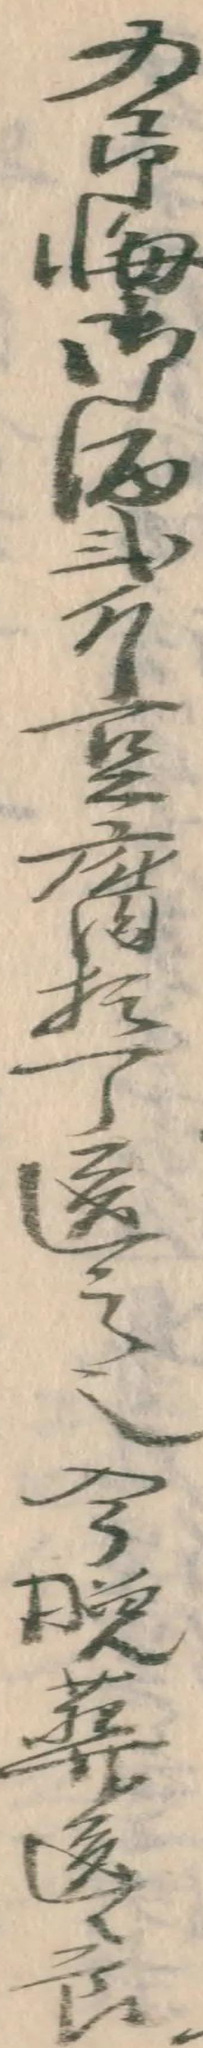為弔悔御酒弐升豆腐拾丁送之也今晩葬送之節
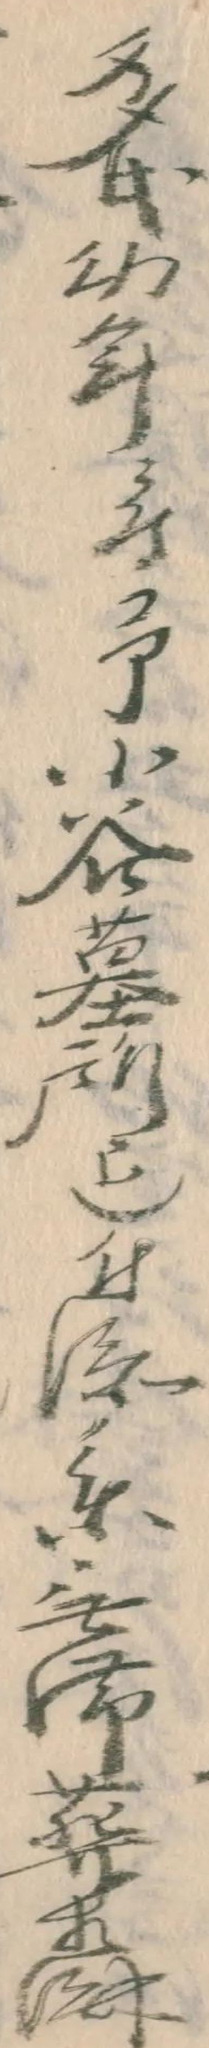多氏幼年ニ付予小谷墓所迄付添参無滞葬相済了
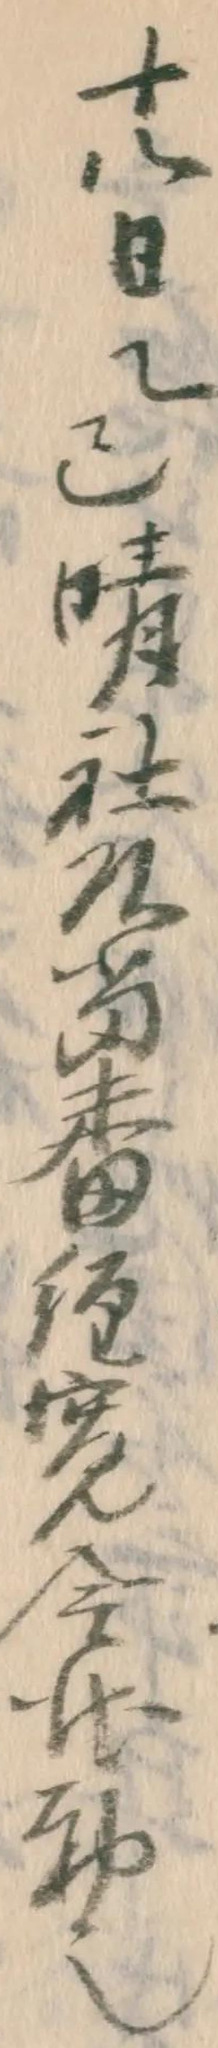十八日乙巳晴社頭當番経寛令代勤也
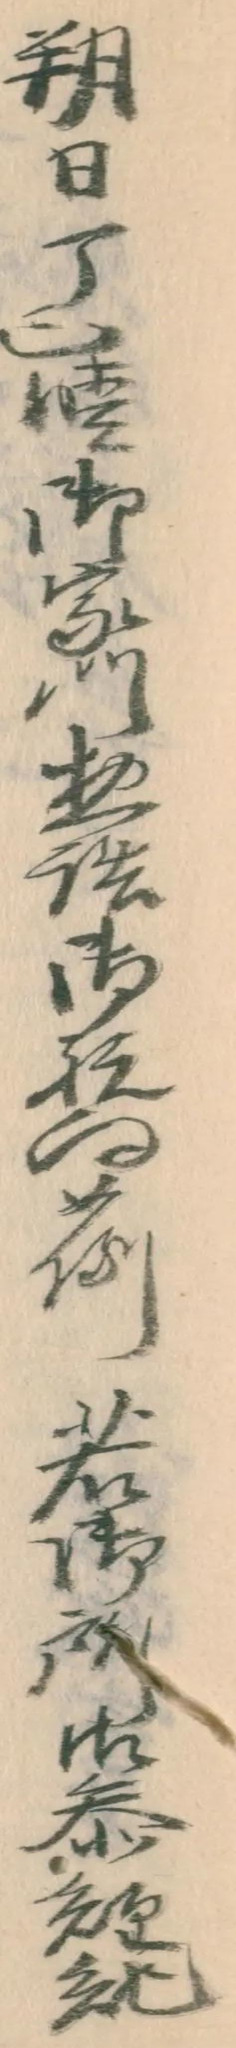朔日丁巳曇御家門惣詰御祝向如例若御所御参経紀
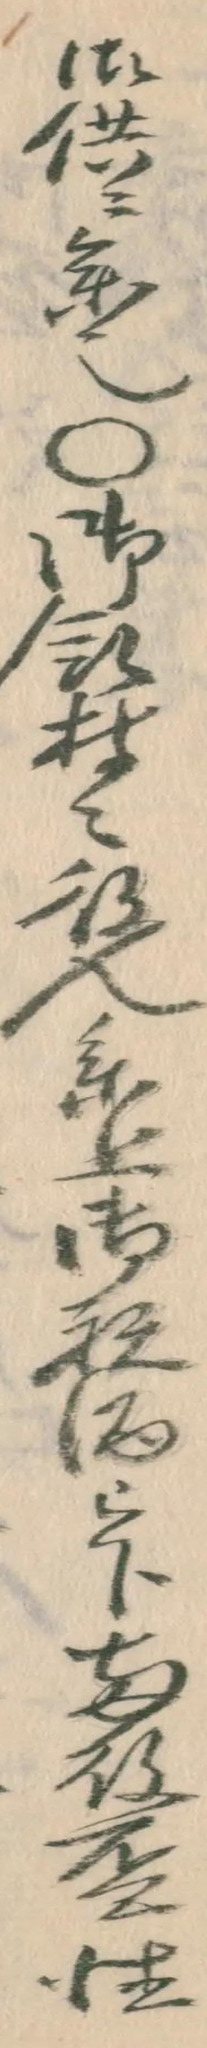御供ニ参也○御領村々役人参上御祝酒被下両役盃徳
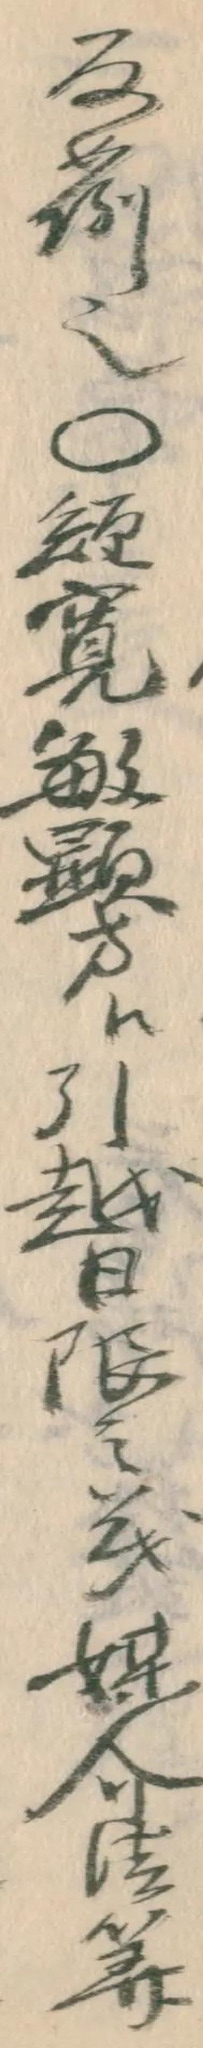反如例也○経寛敏顕方え引越日限之義媒介清算
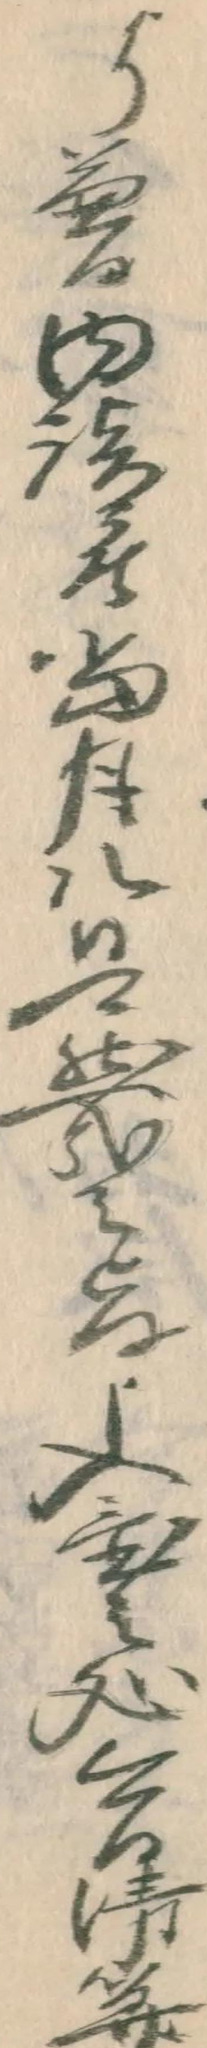より兼日内談二付當月八日可然哉之旨申入置之処今日清算
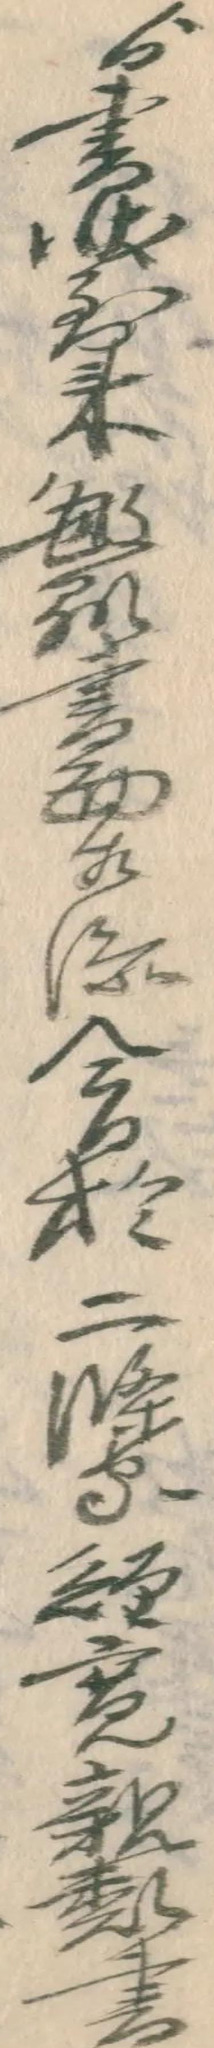ゟ書状到来敏顕書面相添今日於二條家経寛親類書
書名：賀茂社記録. 第67冊
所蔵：国立国会図書館 National Diet Library, JAPAN
